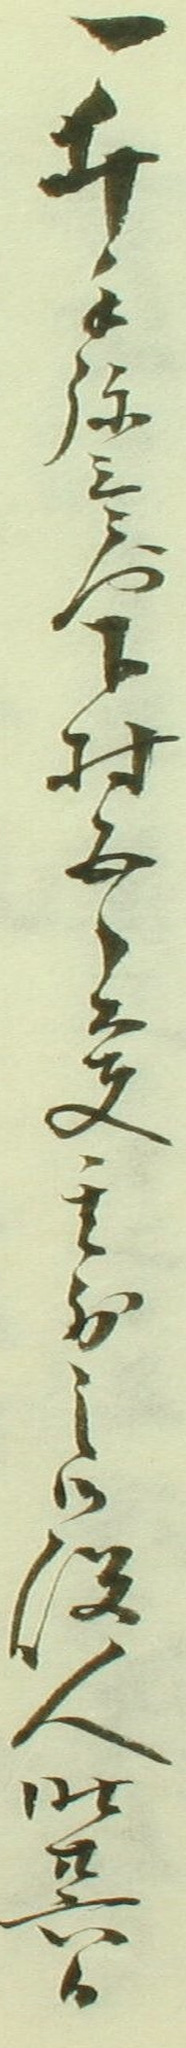一井手弥三右衛門下村五郎太夫其外之御役人昨廿六日
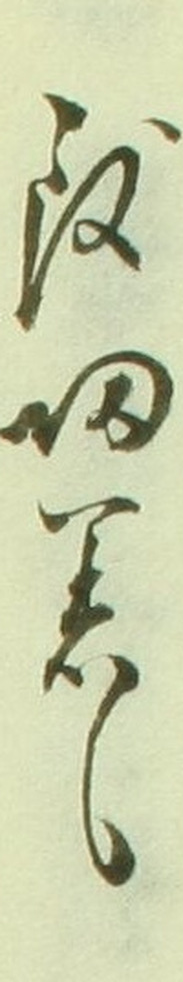致帰着候
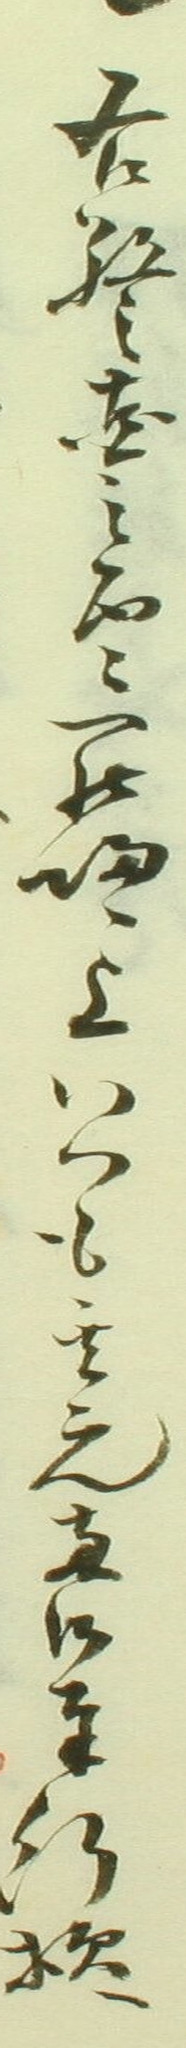一右警固之面々罷帰候上いつも其元両御奉行様へ
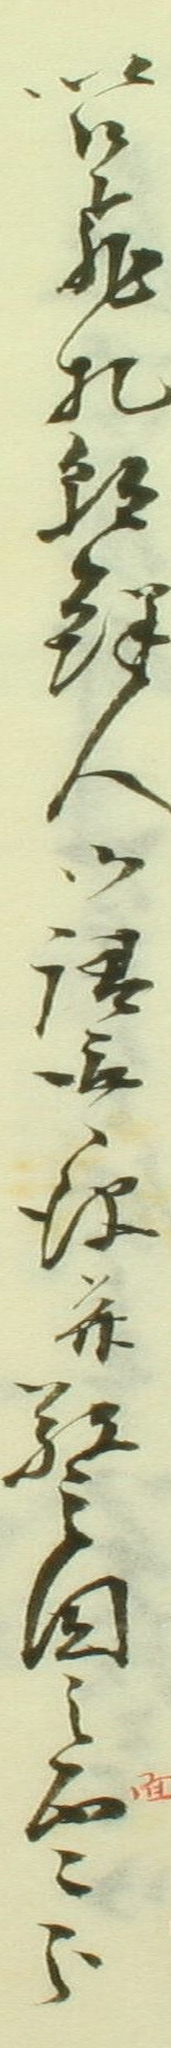以飛札朝鮮人御請取候儀并警固之面々被
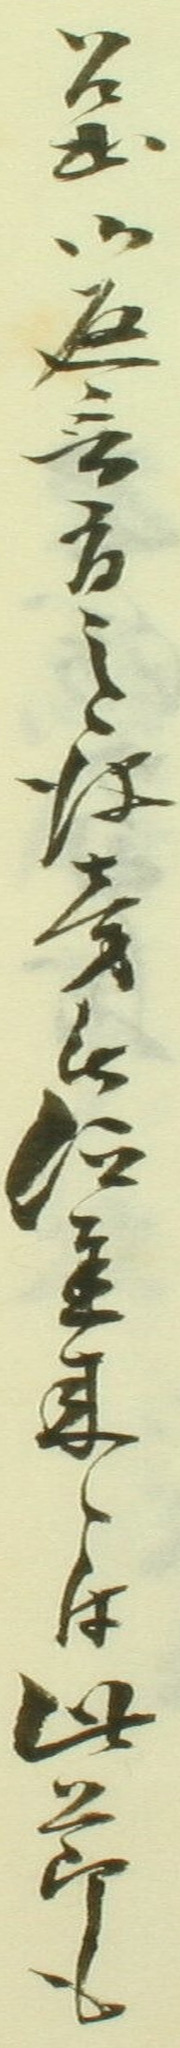召出御返言之候儀旁被仰達来候付此節も
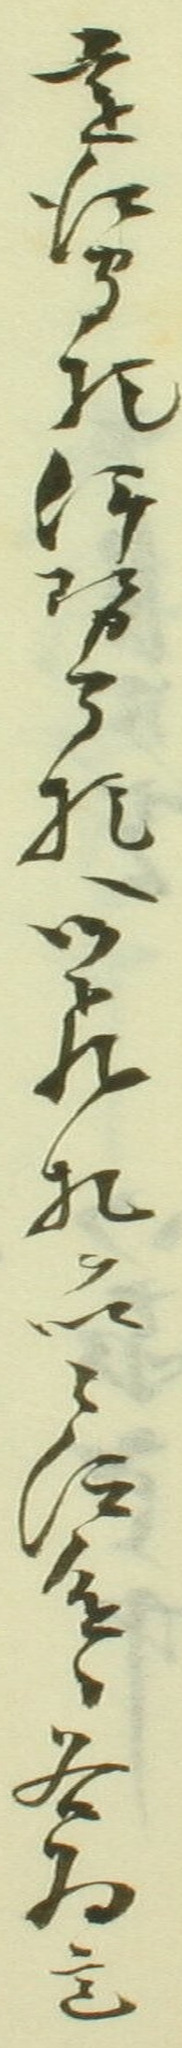遠江守様伊勢守様へ御飛札ヲ以被仰進候各為意
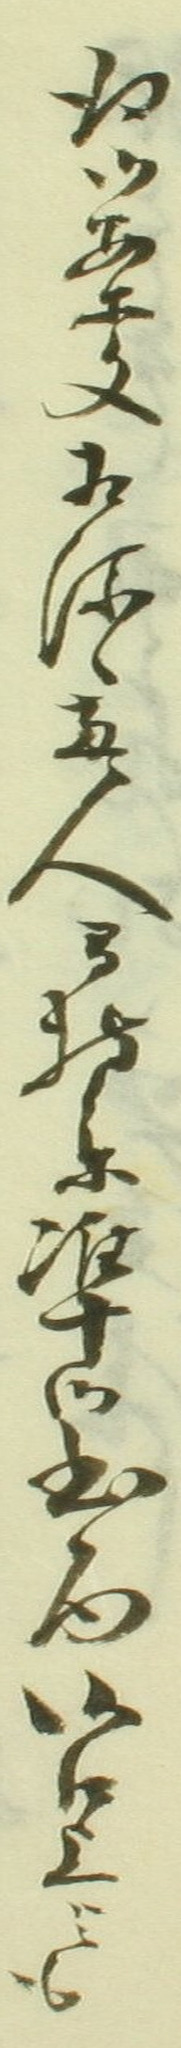得御案文相添候両人等持参準備御書面御口上とも
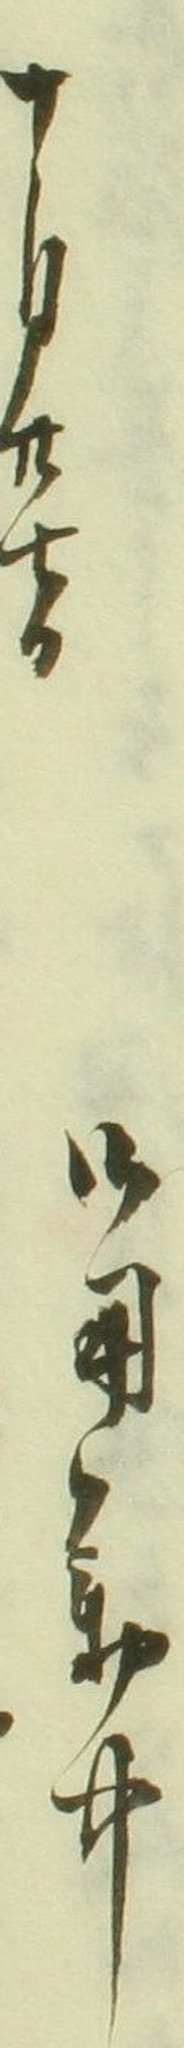十月廿七日御用勤中
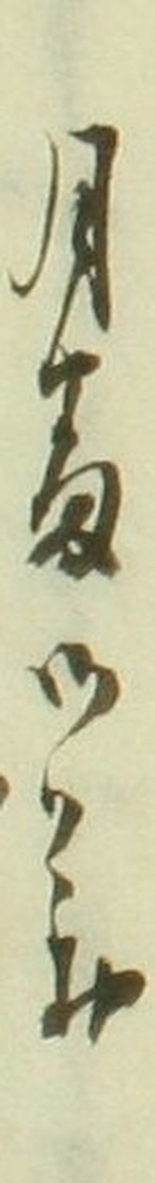月番御勤
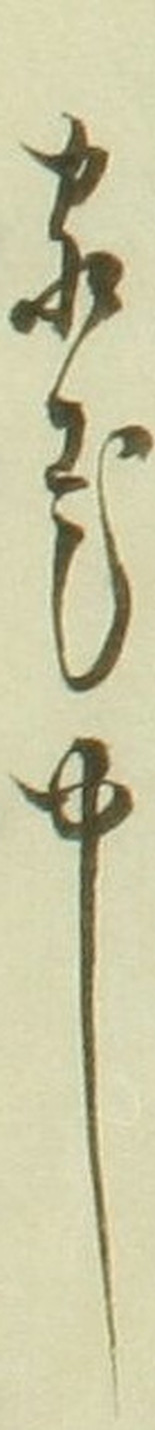家老中
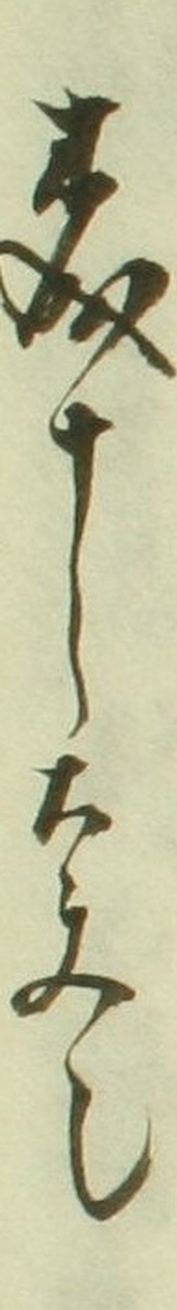森十郎大夫殿
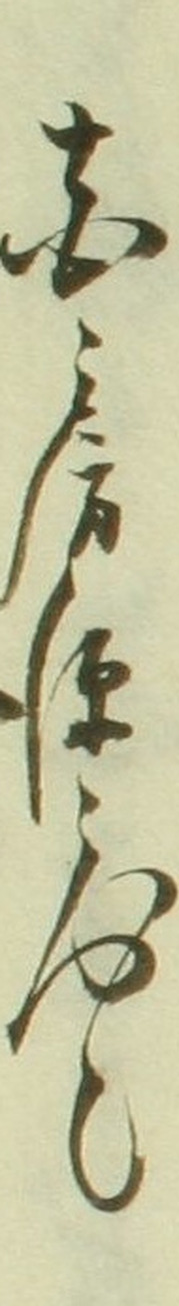国房源右衛門殿
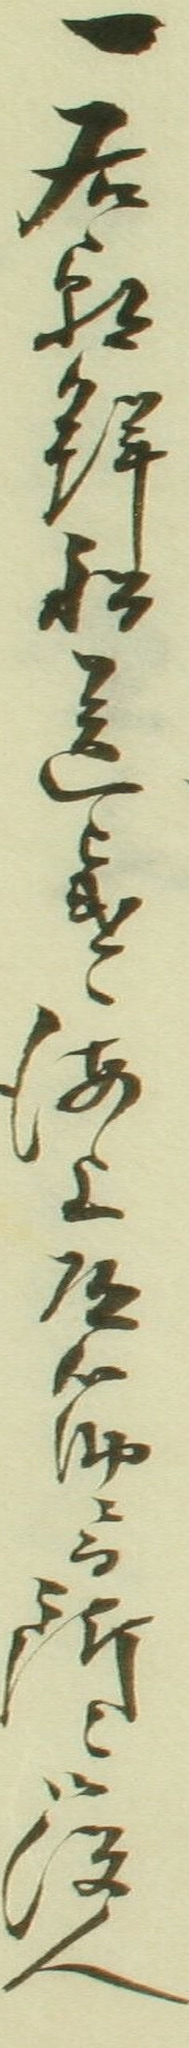一右朝鮮船送被遣候海上道筋ニ而所々御役人
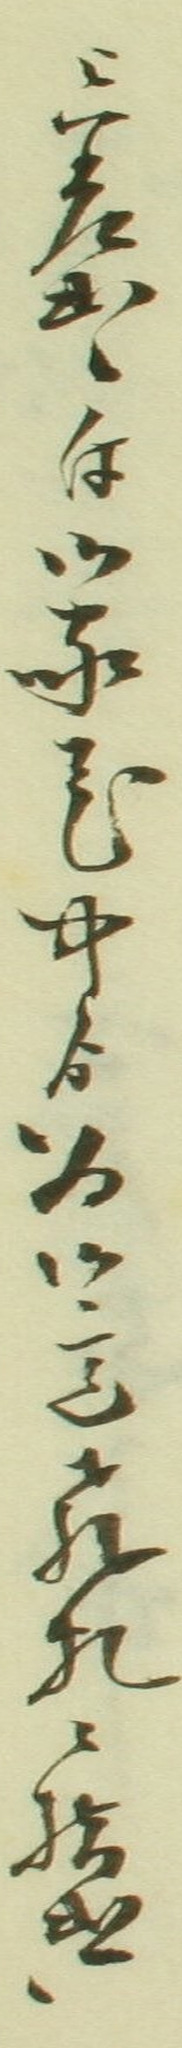被差出候付御家老中ゟ為御意飛札被指遣候

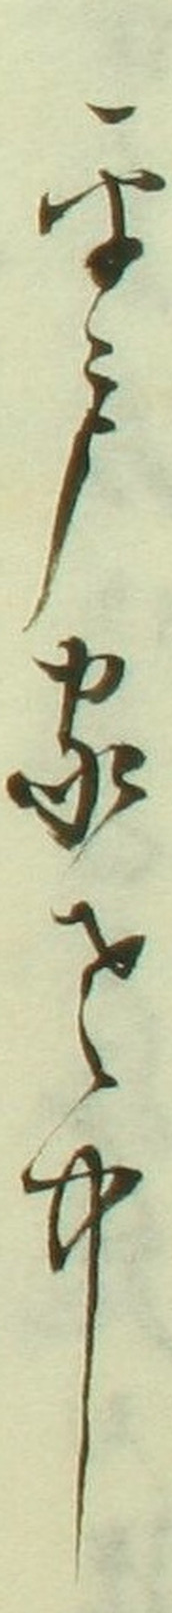平戸家老中
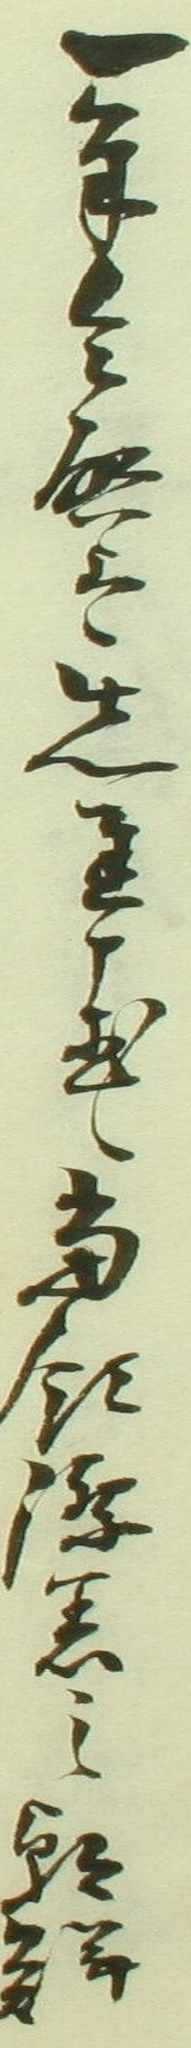一筆令啓上候先達申置候当領漂着之朝鮮
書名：異国船漂着記
